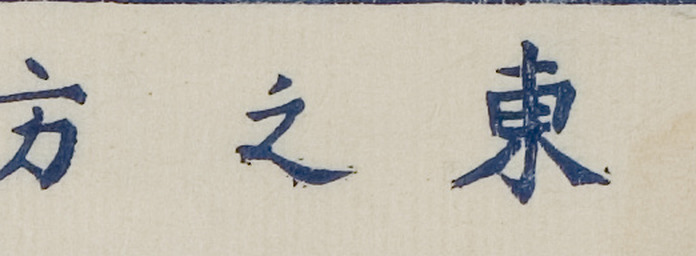東之方
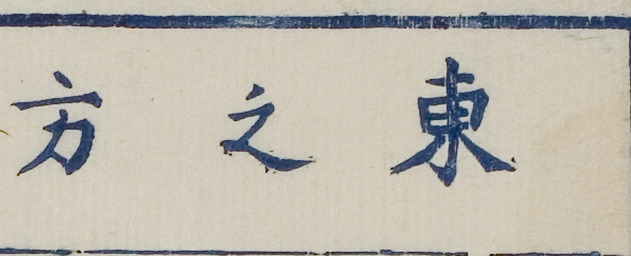東之方
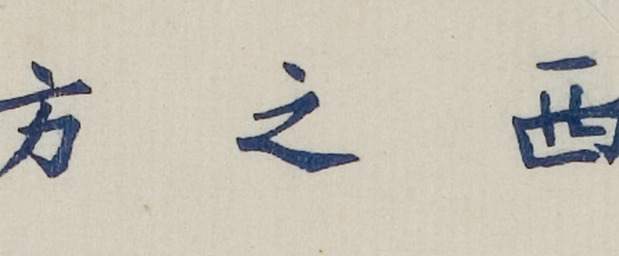東之方
